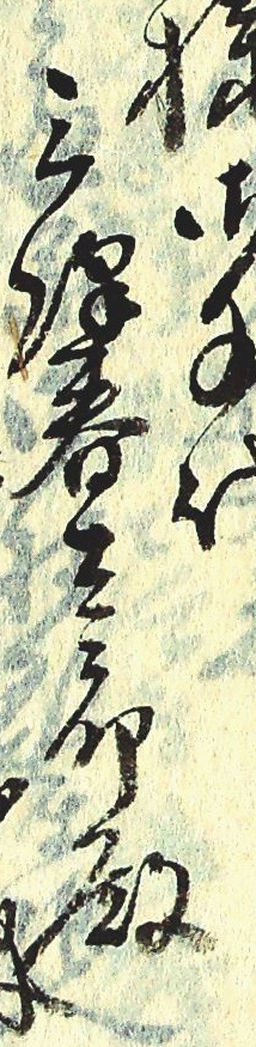三沢春太郎殿
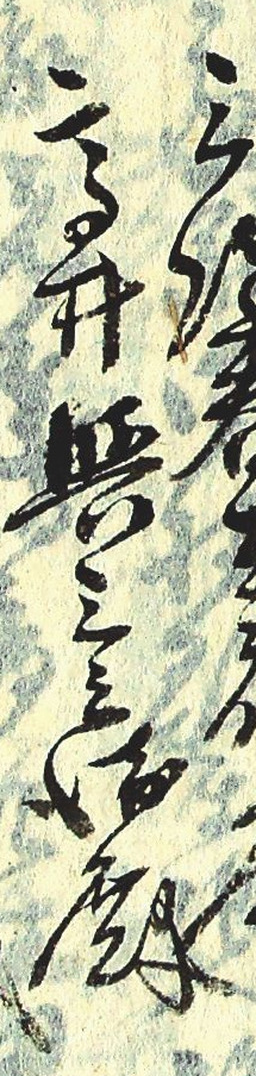高井与三兵衛殿
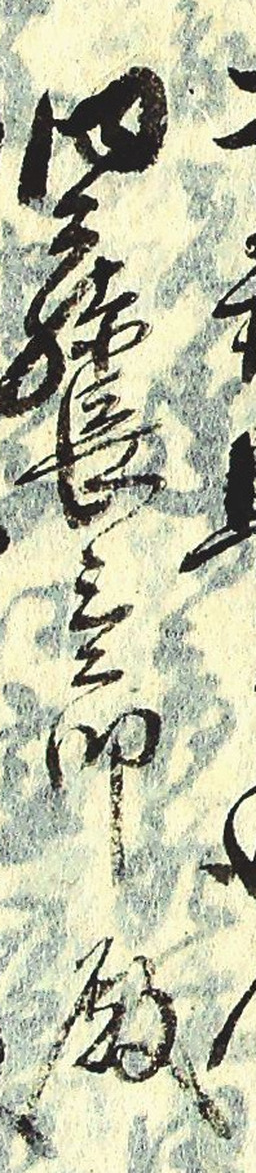内藤長三郎殿
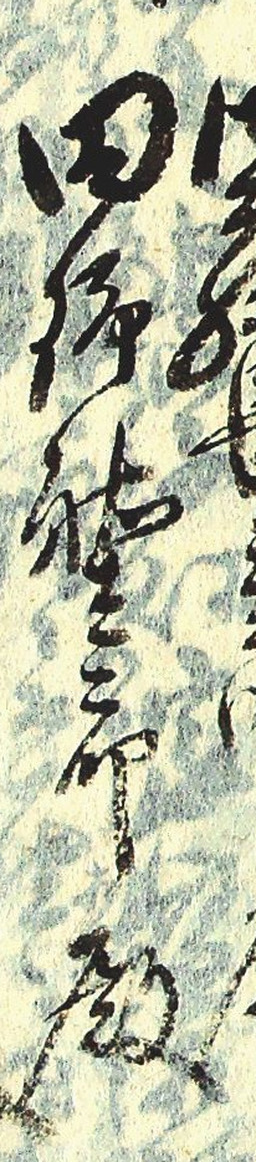田野祐太郎殿
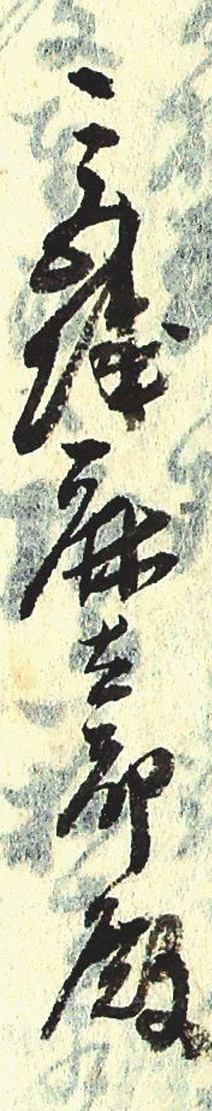宮城麻太郎殿

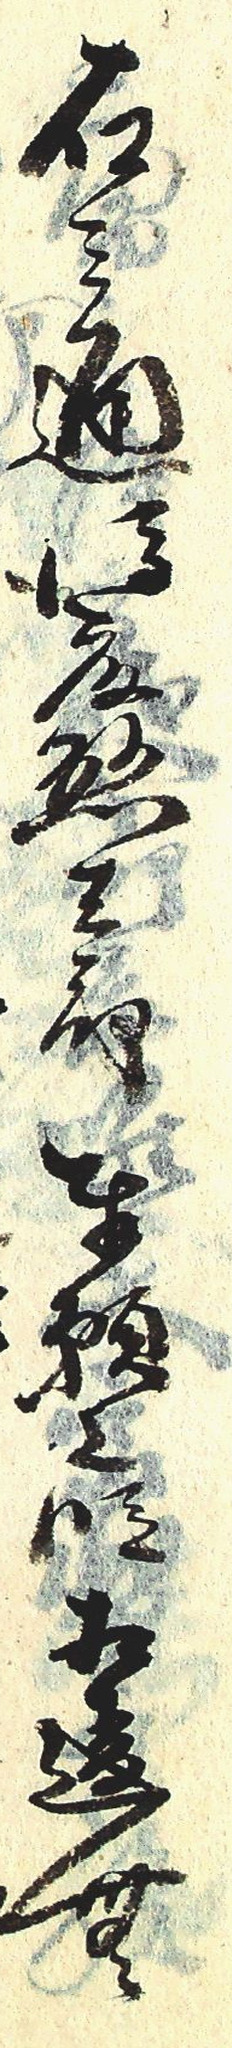右之通後藤熊太郎奉願上段相違無
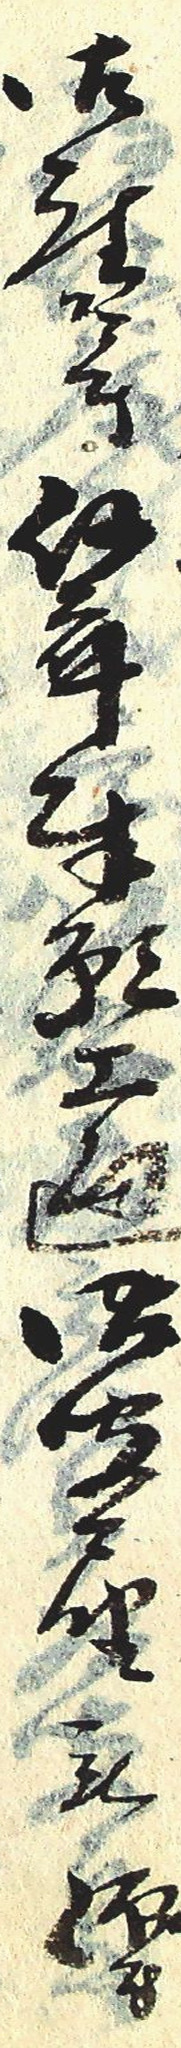御座候に付何卒奉願上通御聞届被仰付
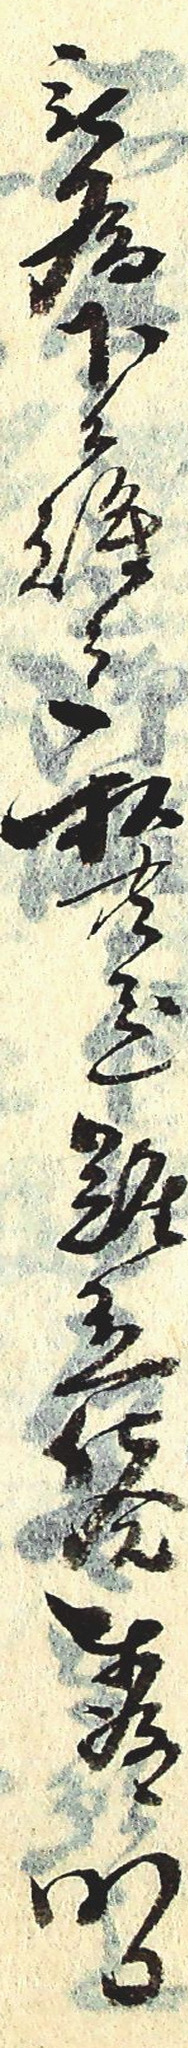被為下候得は私共迄難有仕合奉存候仍て
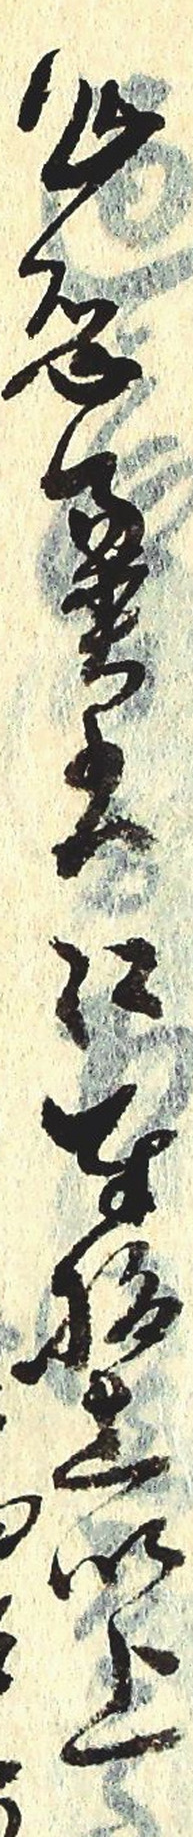乍恐奥書仕奉指上以上
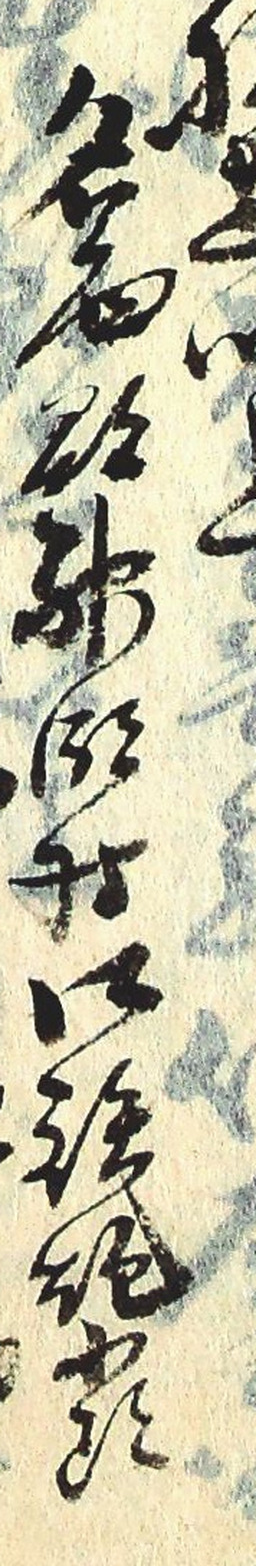名西郡神領村郷鉄炮小頭
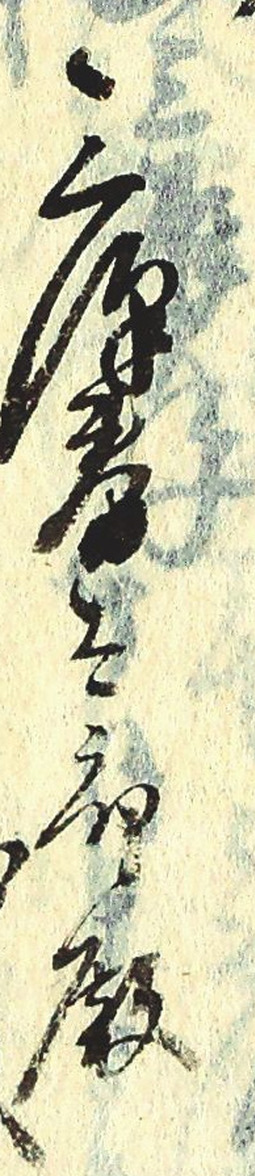三沢春太郎殿
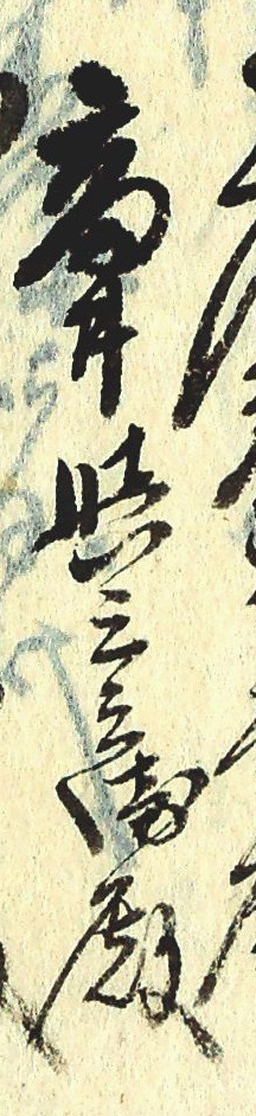高井与三兵衛殿
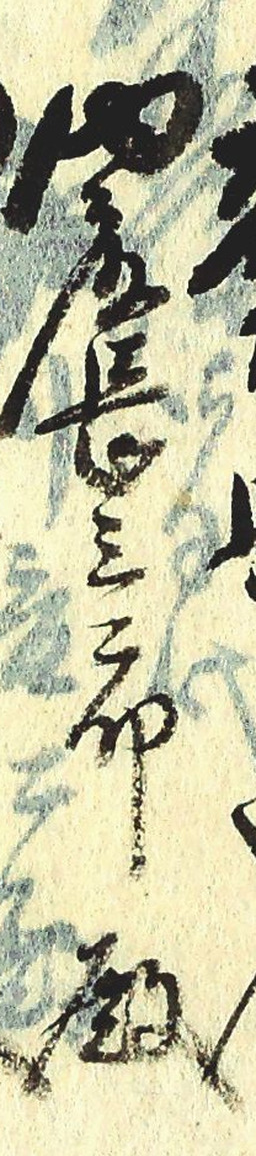内藤長三郎殿
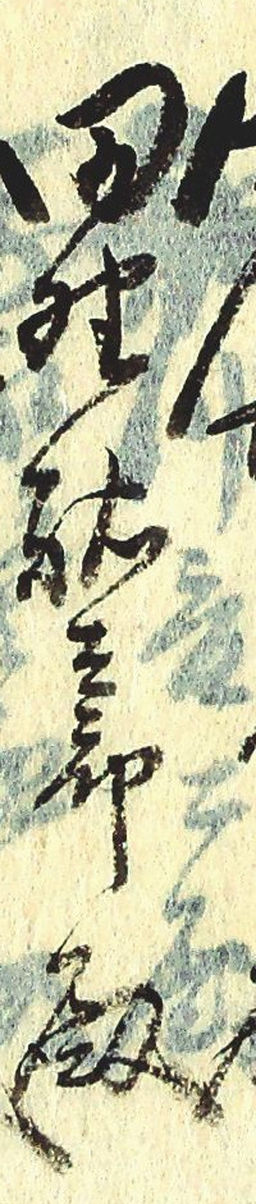田野祐太郎殿
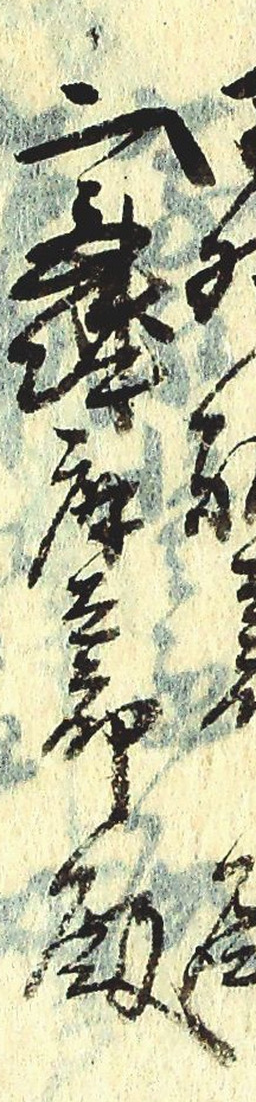宮城麻太郎殿
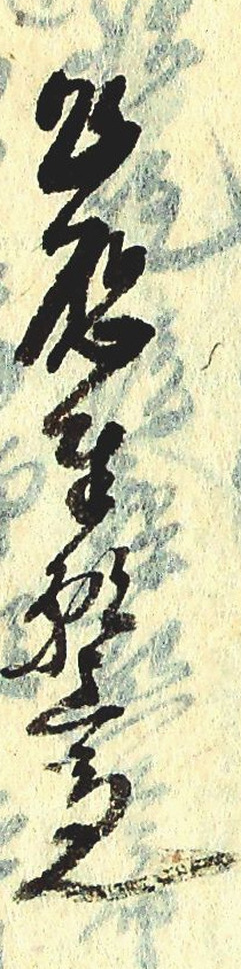乍恐奉願上覚
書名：諸御願書控(弐番）
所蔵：鳴門教育大学 Naruto University of Education
